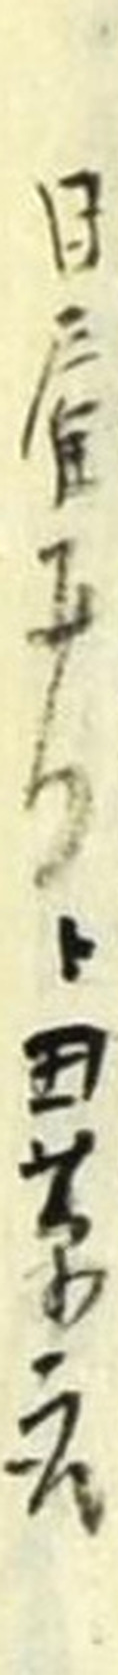日雇みつト田草取

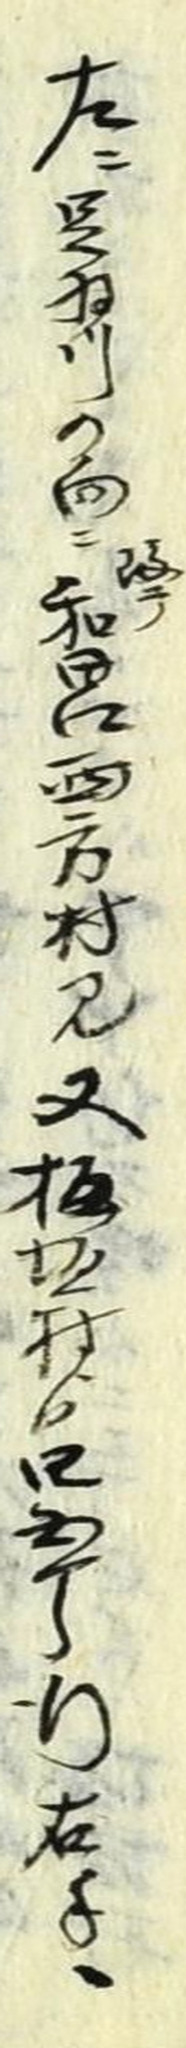左ニ足羽川の向ニ改テ和田郷西方村見又板垣村ゟ四五丁行右手へ
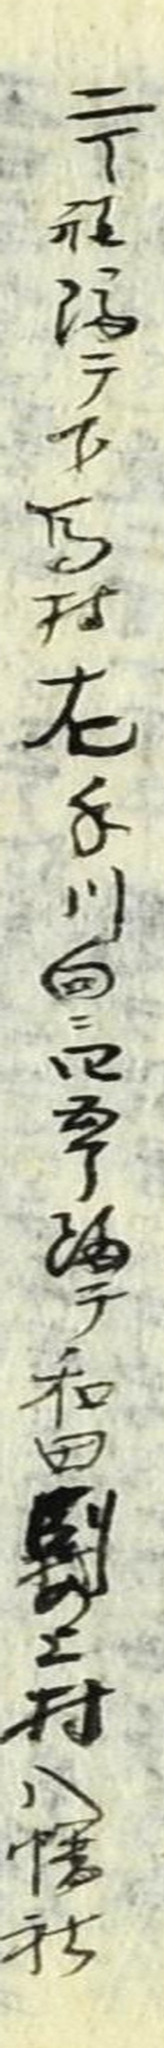二丁程隔テ下馬村左手川向に四五丁隔テ和田淵の上村八幡社
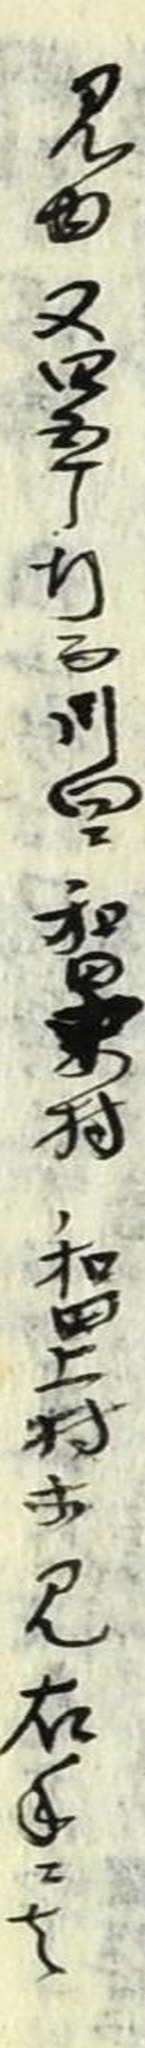見ゆ又四五丁行西川向に和田東村和田上村等見右手ニ者
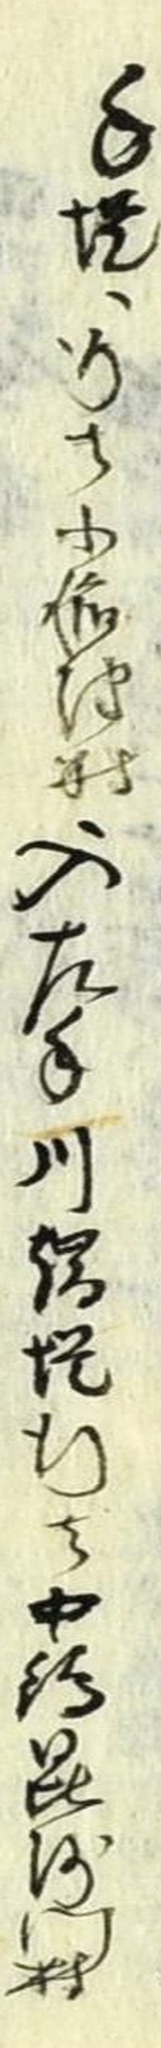手堤へ行者小稲津村へ入左手川端堤行者中島毘沙門村
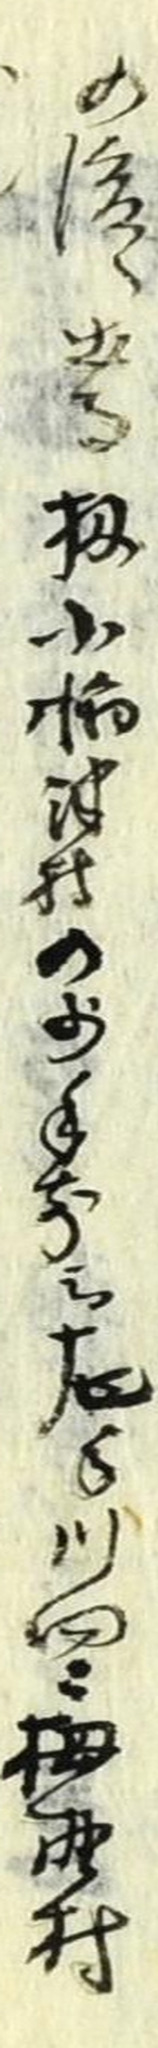の後へ出る扨小稲津村の少手前ニ而左手川向に栂野村
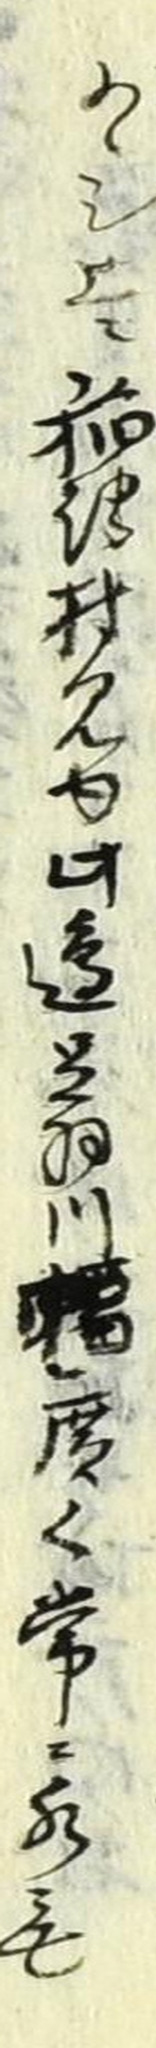少シ上ニ稲津村見ゆ此辺足羽川幅広く常ニ水無
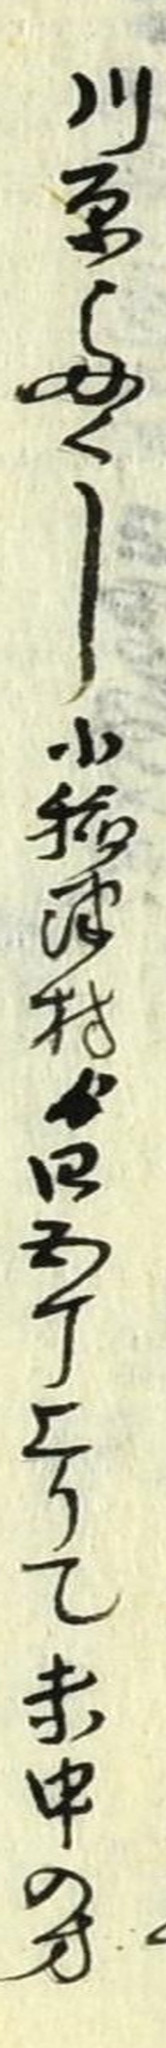川原多くし小稲津村ゟ四五丁上りて未申の方
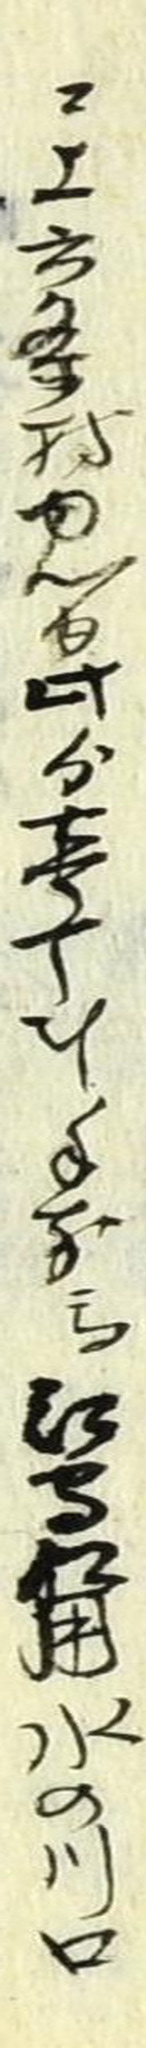ニ上六条村見ゆ此ゟ壱丁計手前に而江守郷用水の川口
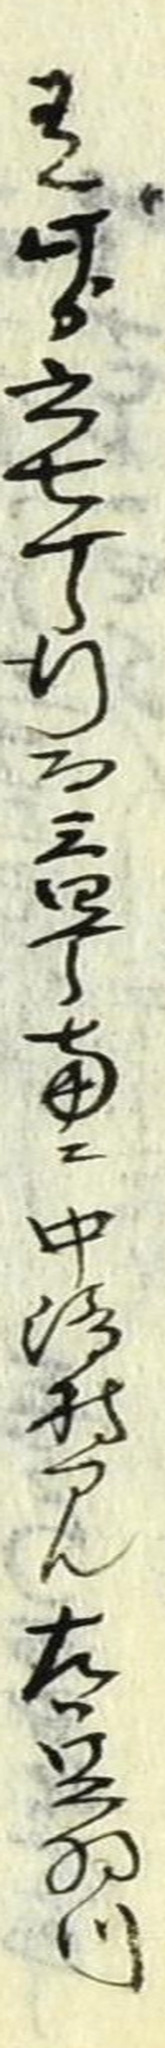有此ゟ六七丁行而三四丁南ニ中島村見左ハ足羽川
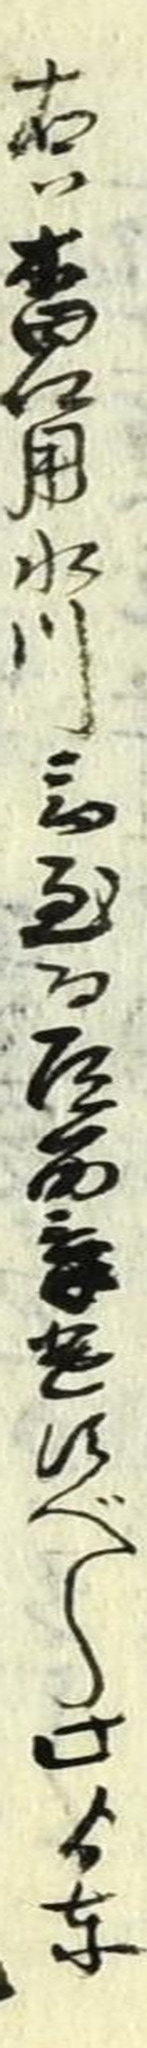右ハ木田郷用水川ニ而至而道筋気遣すべし此ゟ東
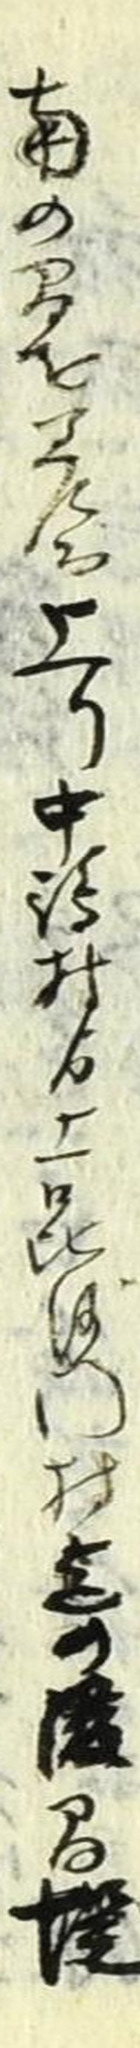南の間を差而上り中島村ゟ上毘沙門村迄の渡間堤
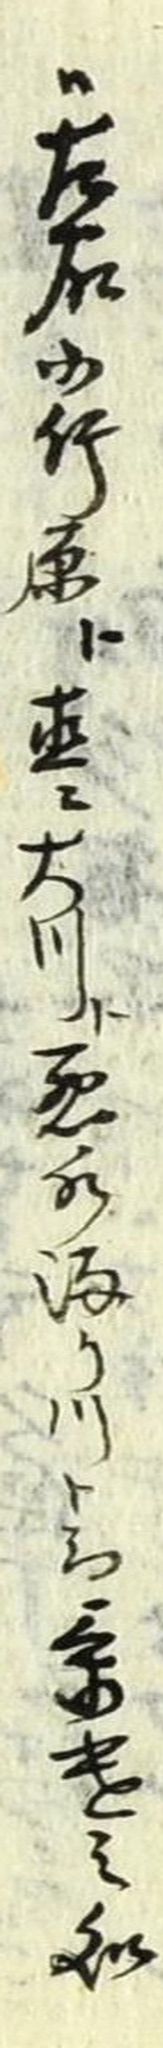ハ左右小竹原と直ニ大川ト悪水溜り川トニ而気遣之処
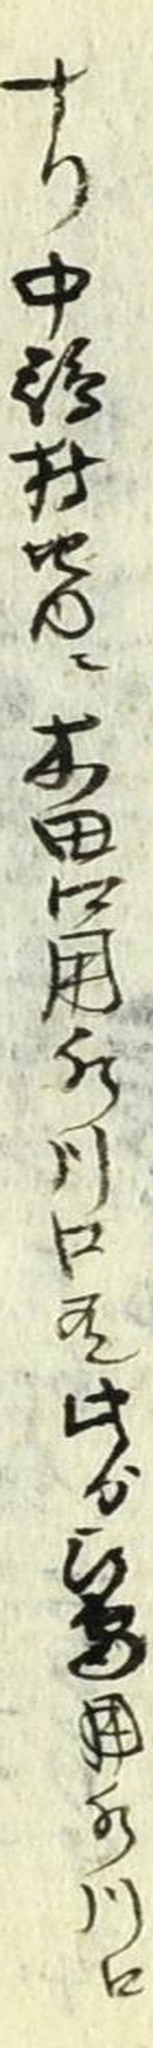ナリ中島村地内に木田郷用水川口有此ゟ江守用水川口
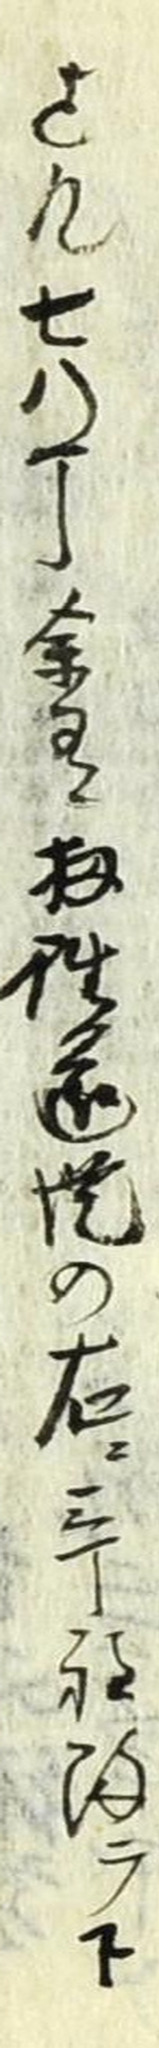迄凡七八丁余有扨往還堤の右に三丁程隔テ下
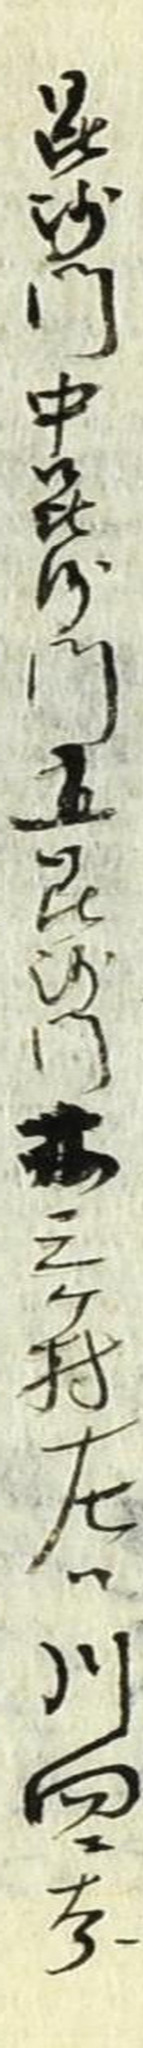毘沙門中毘沙門上毘沙門村三ヶ村左ハ川向ニ太郎
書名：（日記）
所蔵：福井県文書館 Fukui Prefectural Archives
